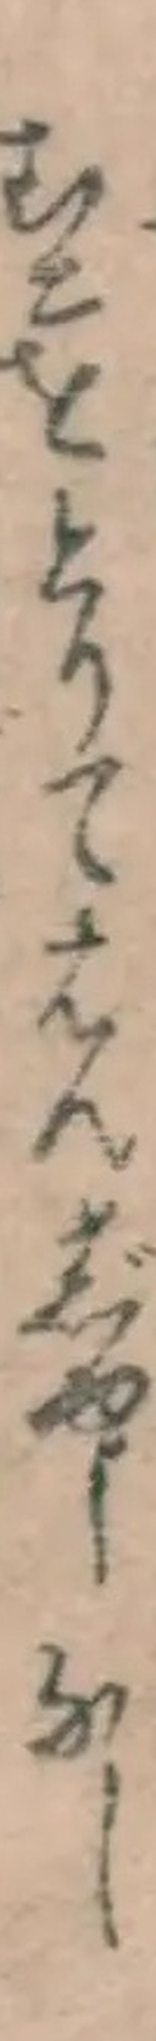むこをとりてはんじやうなし
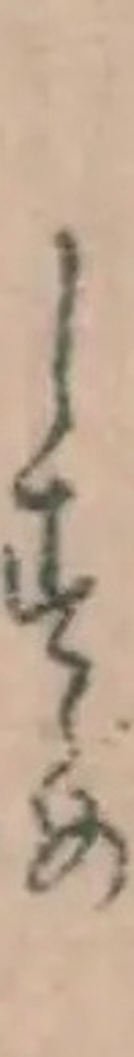しすゝめ
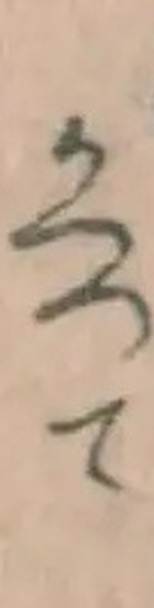かへつて
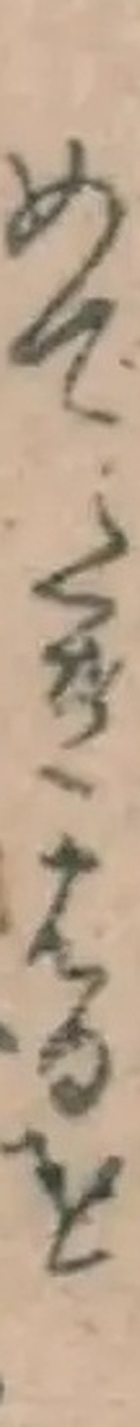めでたきはるを
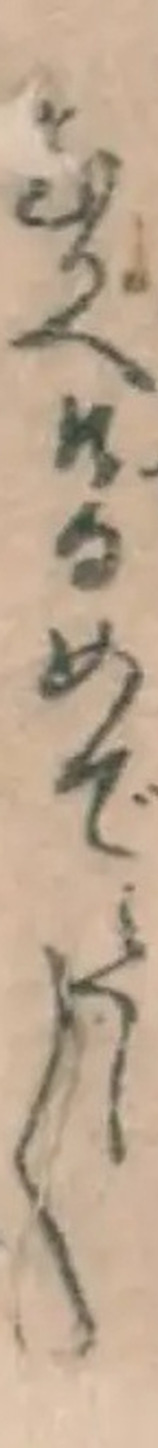むかへけるめでたし
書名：舌切雀
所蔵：国立国会図書館 National Diet Library, JAPAN
